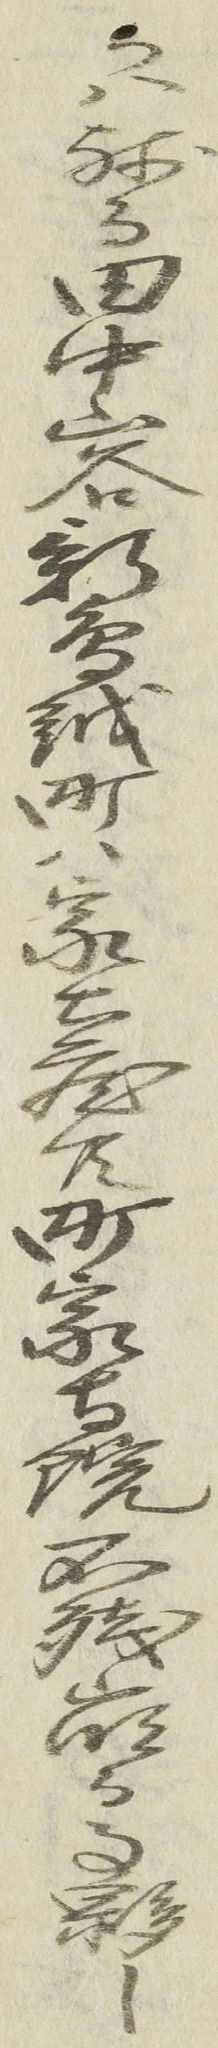うハ残る田中山谷新鳥越町ハ家土蔵共町家寺院不残崩る事夥し
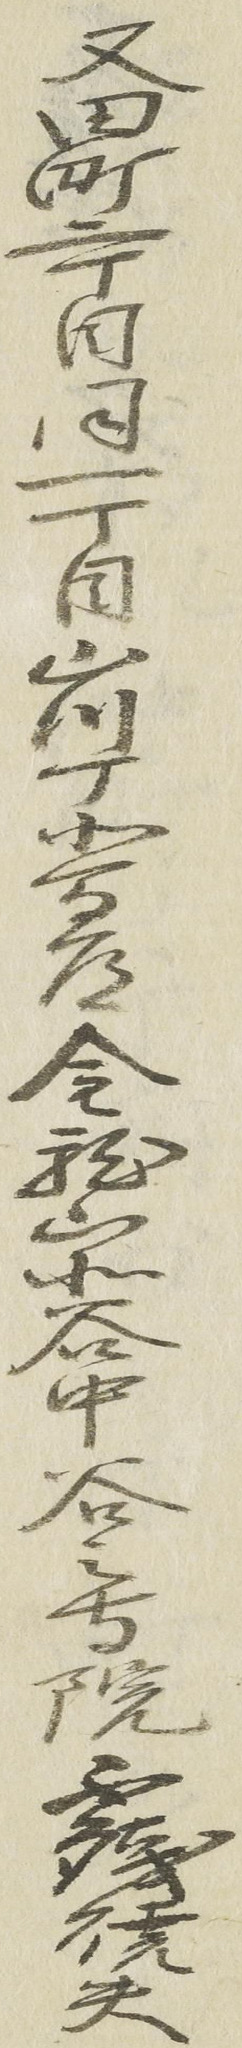又田町二丁目同一丁目山川丁北馬道金龍山北谷中谷之寺院不残焼失
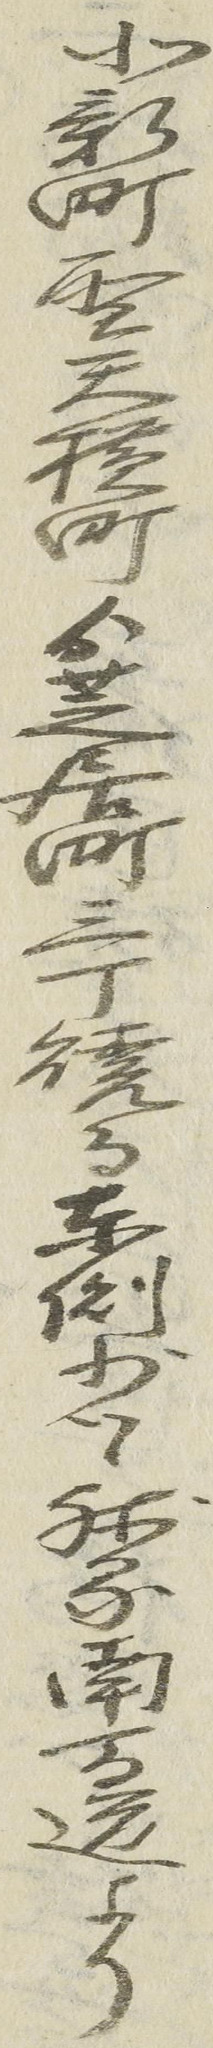北新町聖天横町ゟ芝居町三丁焼る東側少ツヽ残る南馬道より
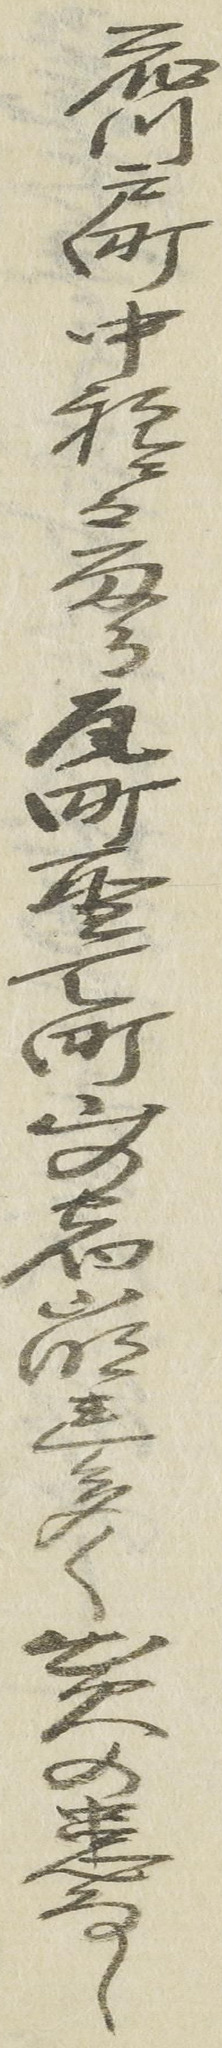花川戸町中程ニ而留る瓦町聖天町山の宿崩れ多く出火の患なし
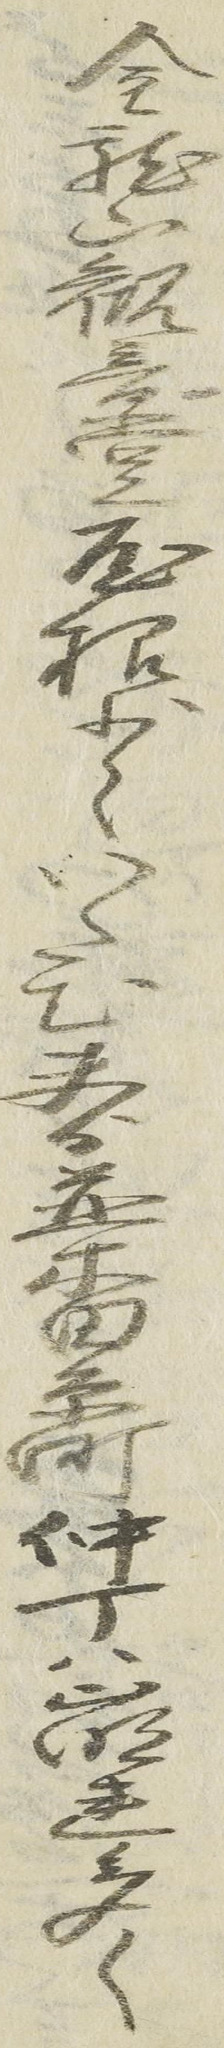金龍山観音堂屋根少しいたむ夫ゟ並木田原町仲丁ハ崩れ多く
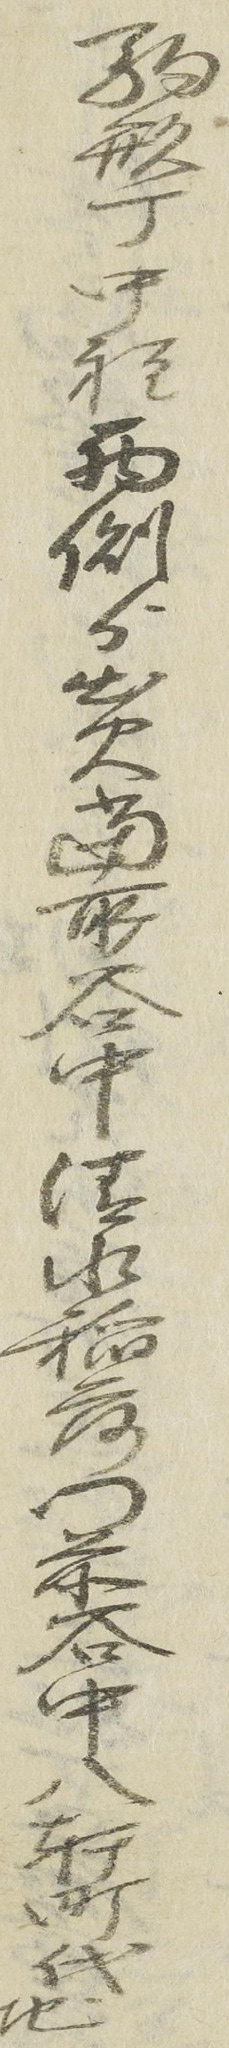駒形丁中程西側ゟ出火当所谷中清水稲荷門前谷中八軒町代地

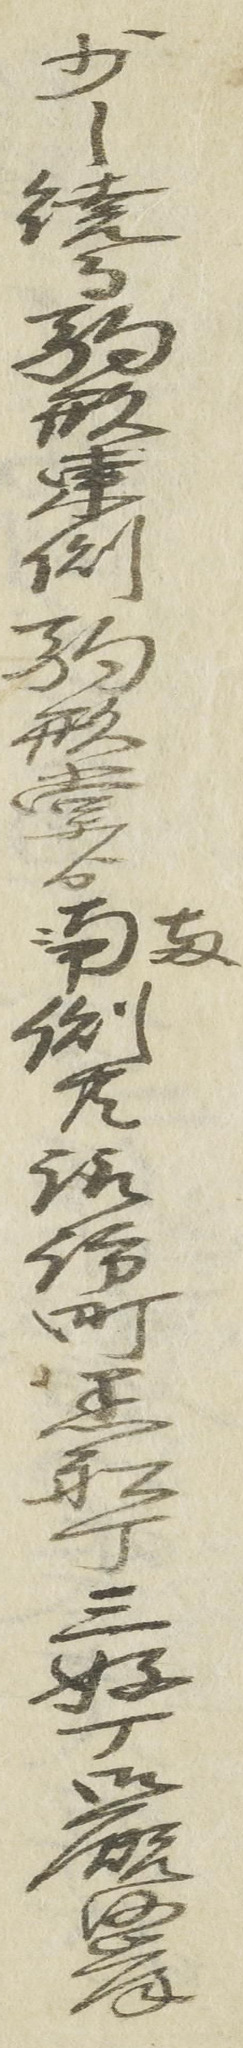少し焼る駒形東側駒形堂ゟ南側共諏訪町黒船丁三好丁御厩河岸
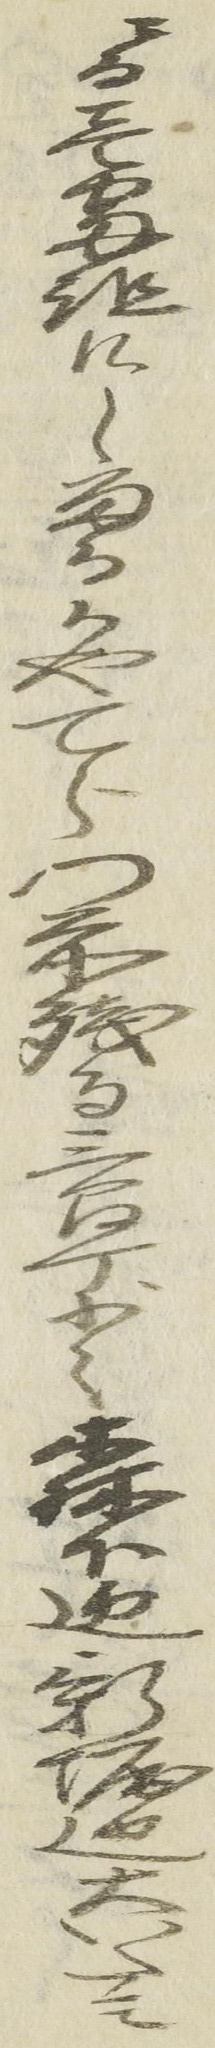ニ而壱番組ケし留るかやてら門前残る三間丁少し森下辺新堀辺大いたミ
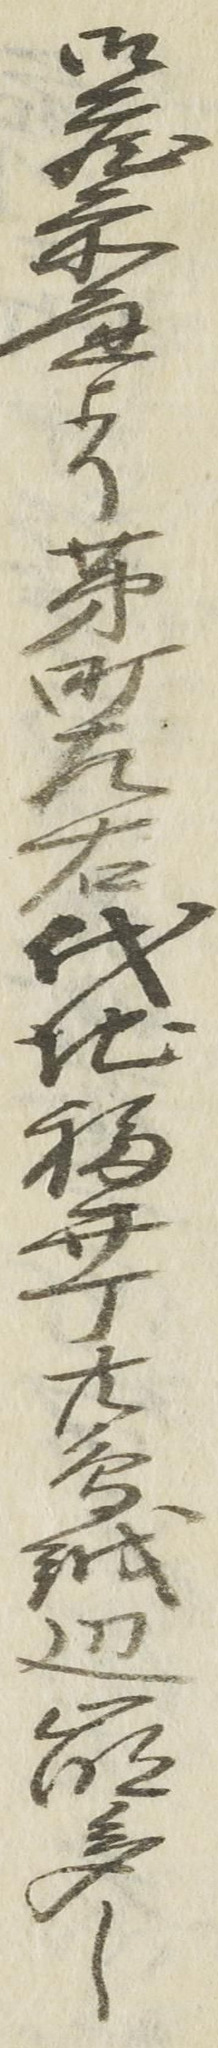御蔵前通より茅町左右代地福井丁共鳥越辺崩多し
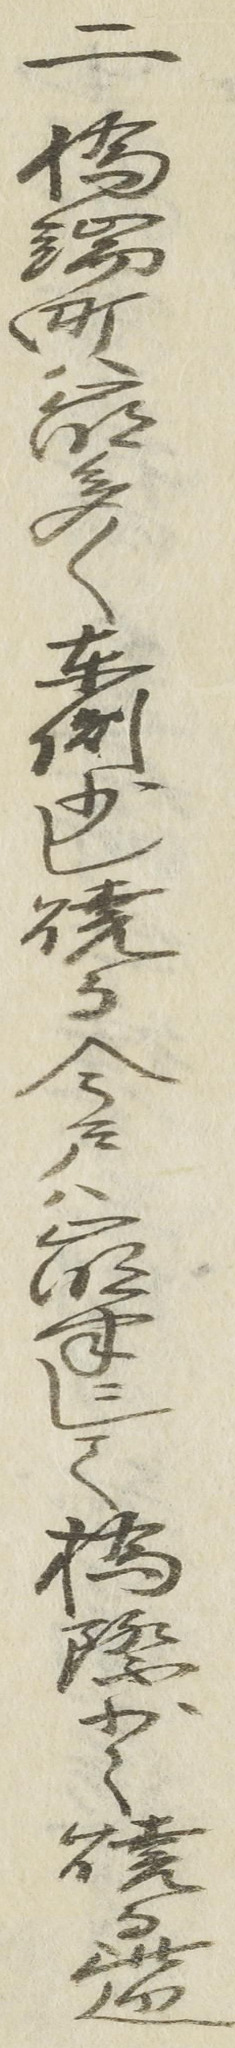二橋端町ハ崩多く東側少し焼る今戸ハ崩半ニして橋際少し焼る此辺
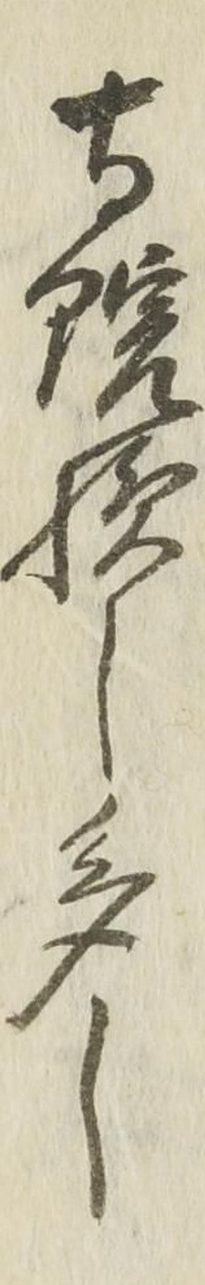寺院損し多し
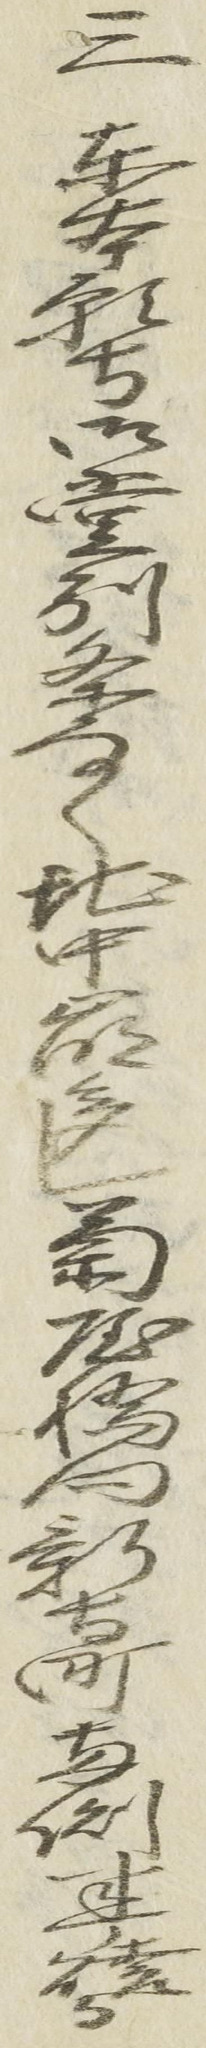三東本願寺御堂別条なく地中崩多し菊屋橋向新寺町両側半焼る
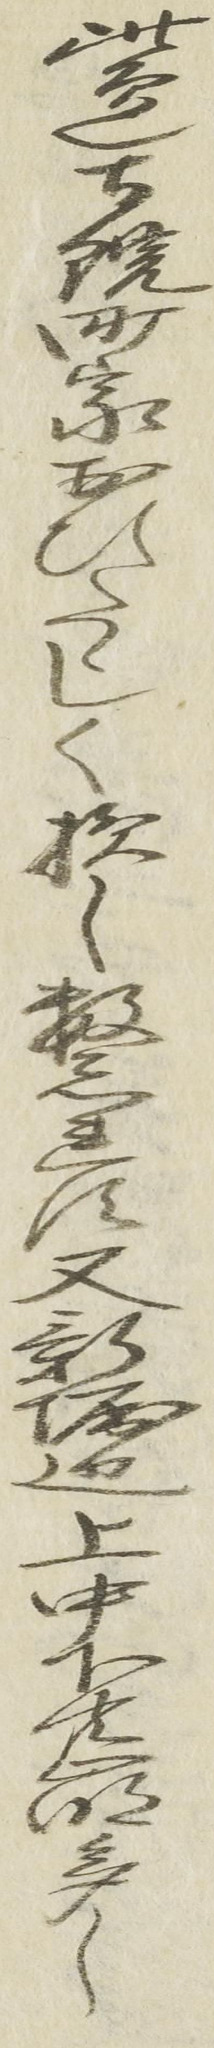此辺寺院町家おひたゝしく損し数しれす又新堀辺上中下共崩多し
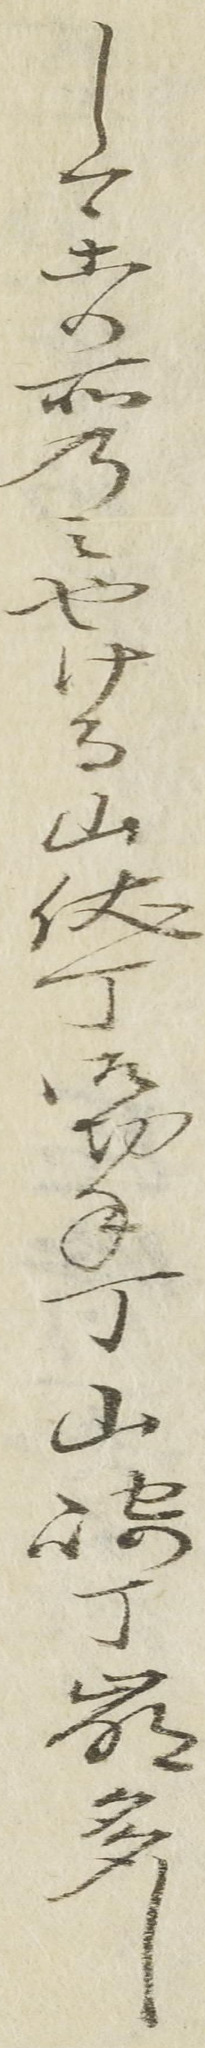してこの所のミやける山伏丁御切手丁山崎丁崩多し
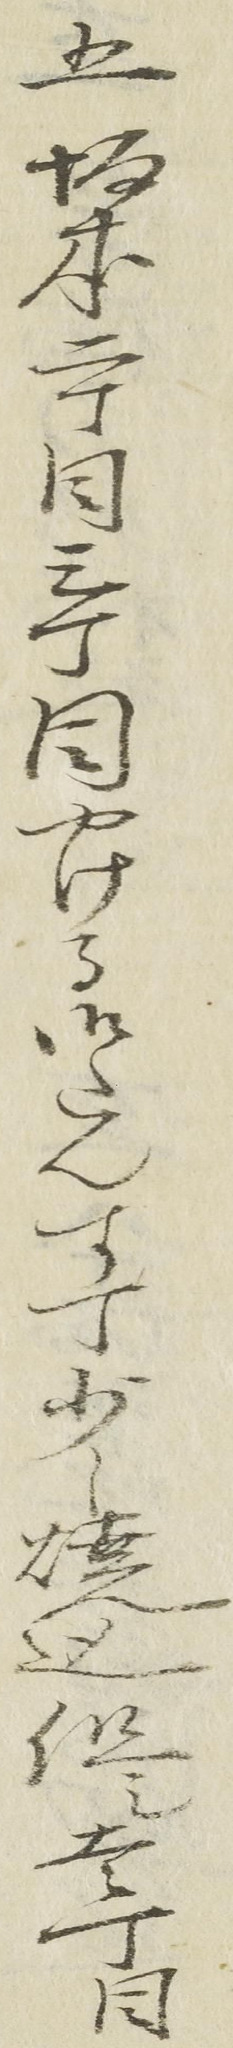五坂本二丁目三丁目やける御たんす丁少し焼込但シ壱丁目
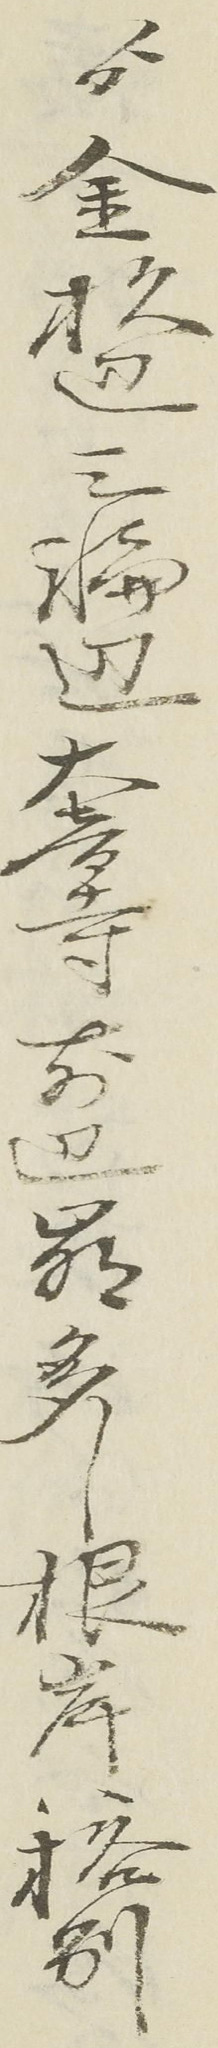ゟ金杉辺三輪辺大音寺前辺崩多し根岸ハ格別
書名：安政乙卯江戸大地震筆記　安政丙辰八月大阪大雷雨之記追加　安政三辰年七月松前辺大地震并八月大風雨記録
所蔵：東京大学地震研究所図書室 Earthquake Research Institute Library, The University of Tokyo, JAPAN
